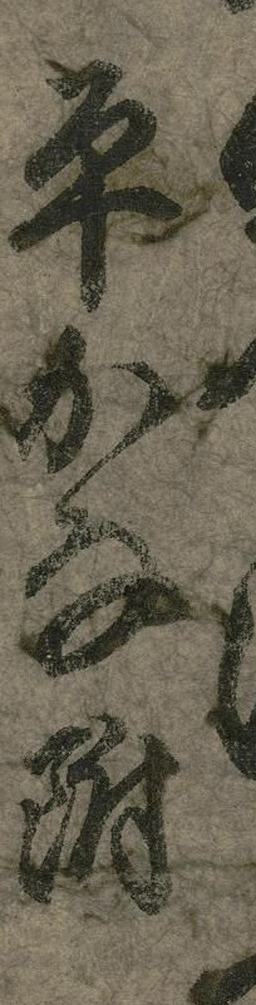平かな附

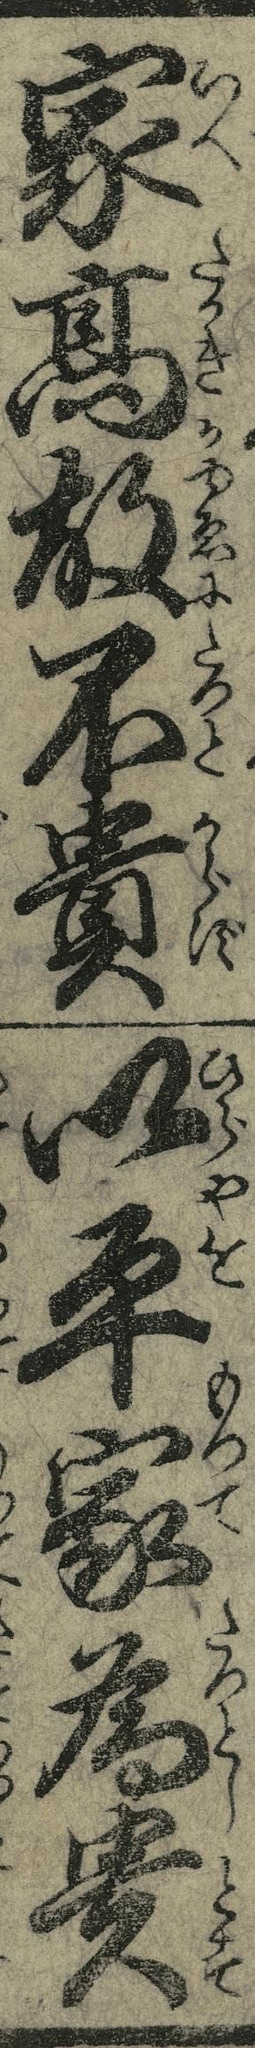家高故不貴以平家為貴
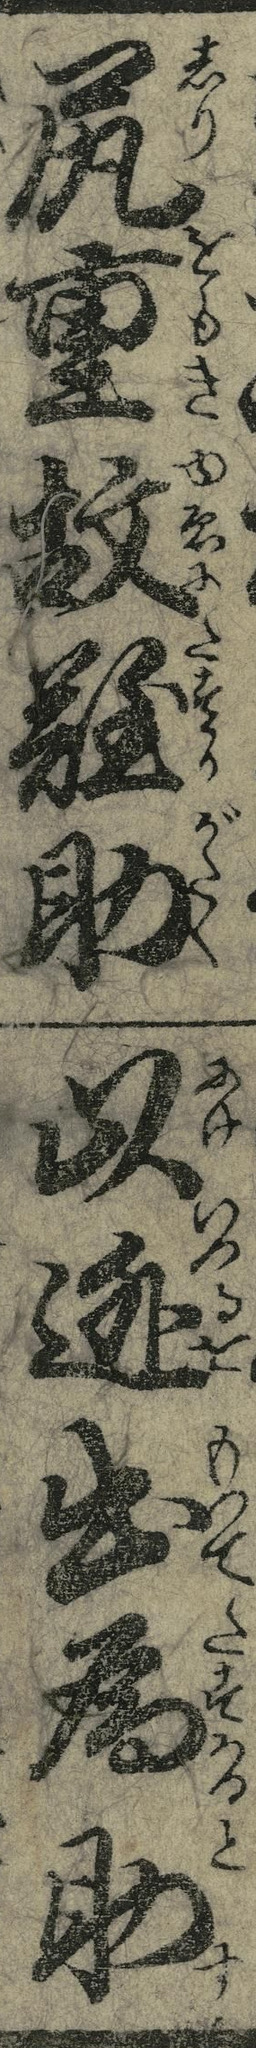尻重故難助以逃出為助
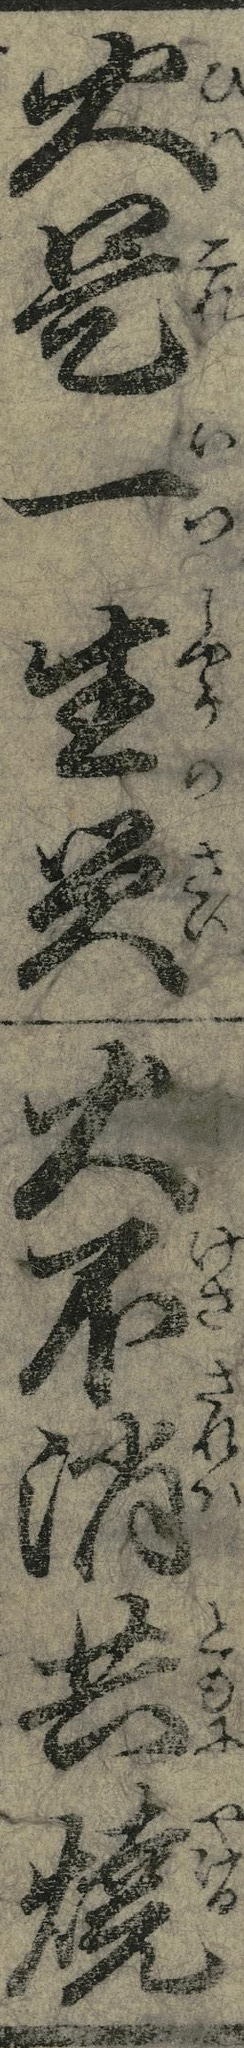火是一生災火不消共焼
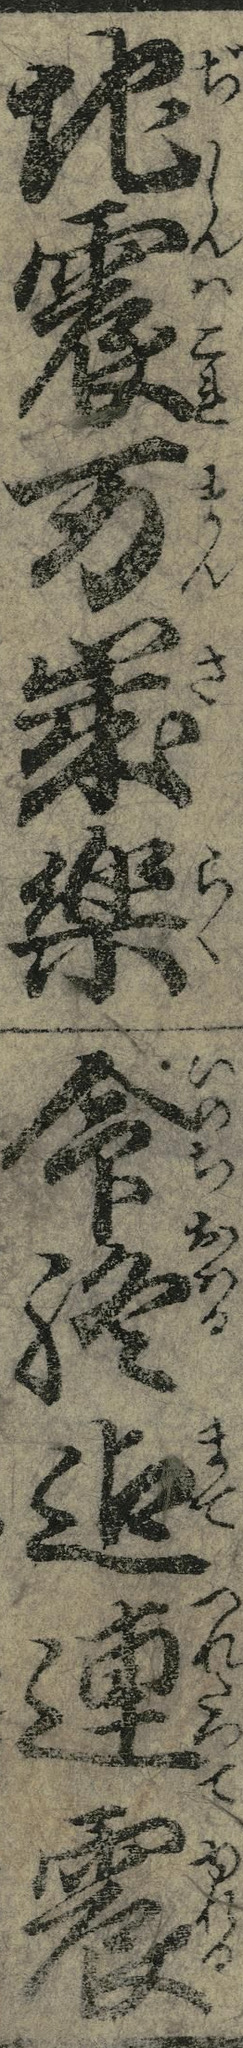地震万歳楽命終迄連震
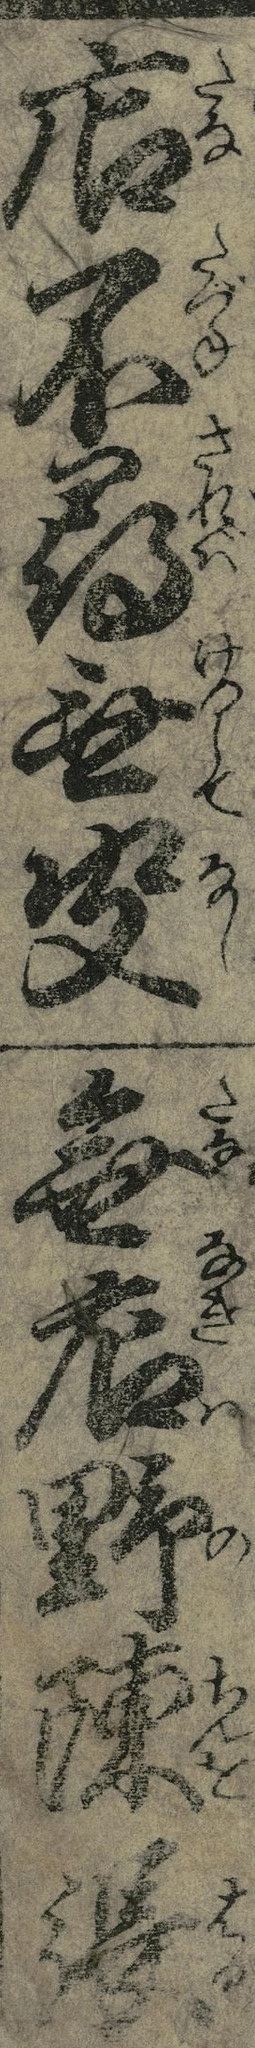店不尋無決無店野陳張

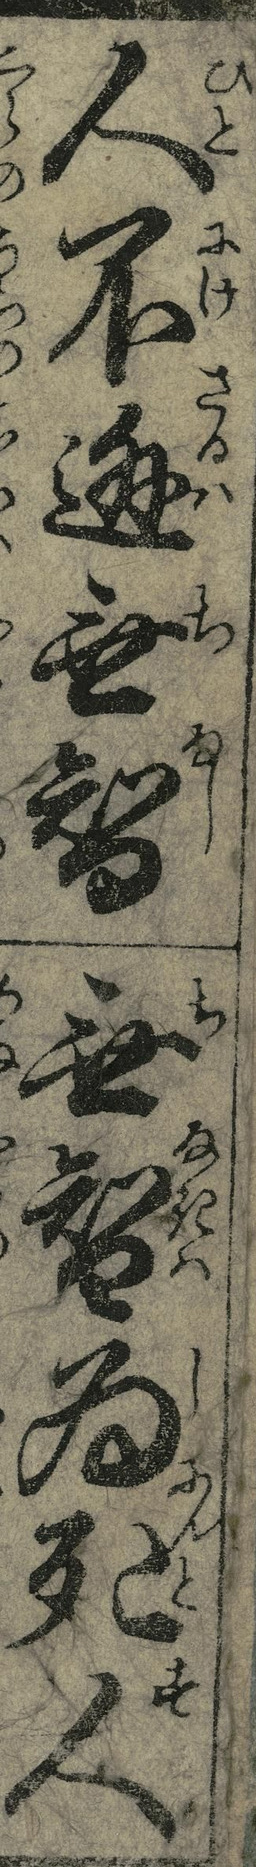人不逃無智無智為死人
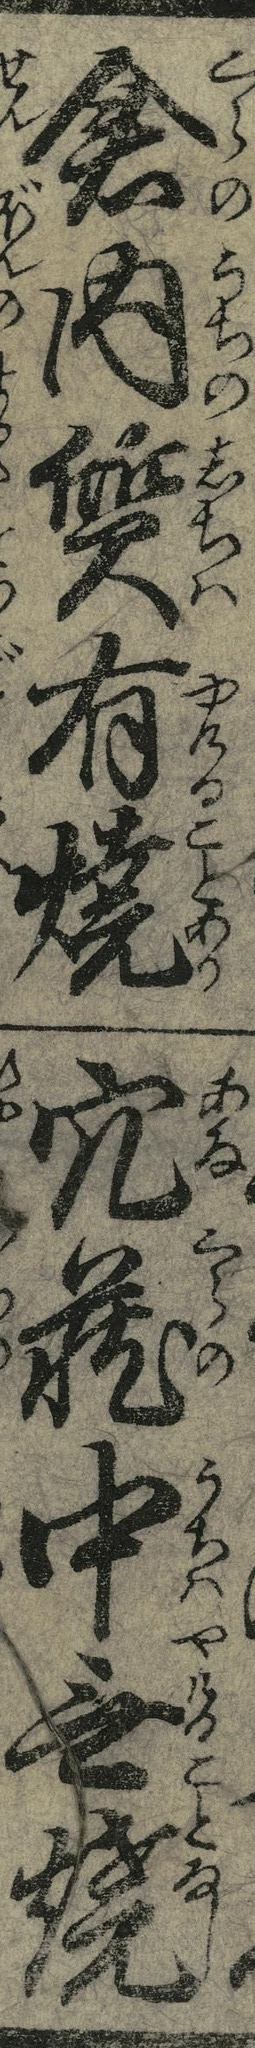倉内質有焼穴蔵中無焼
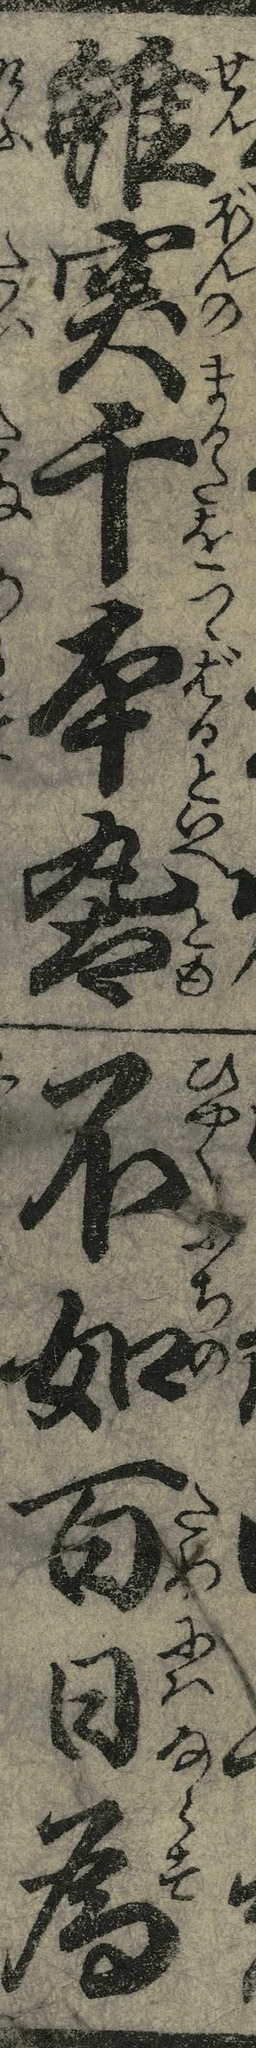難突千本丸太不如百日為
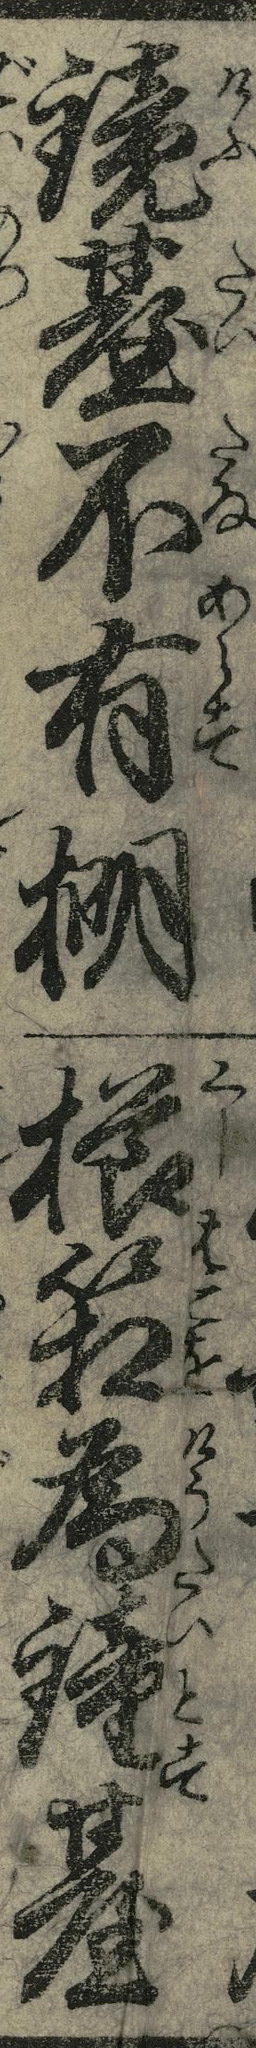鏡台不有棚櫛箱為鐘台
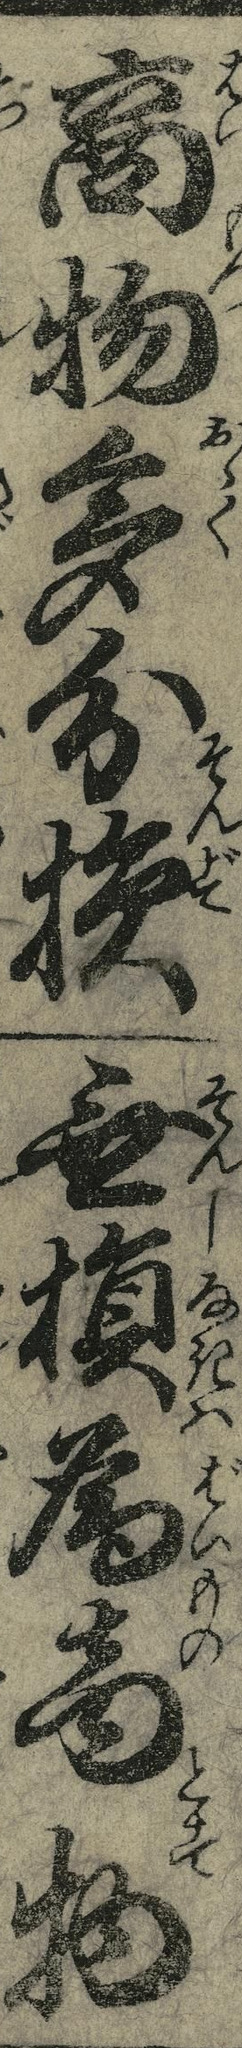商物多分損無損為売物
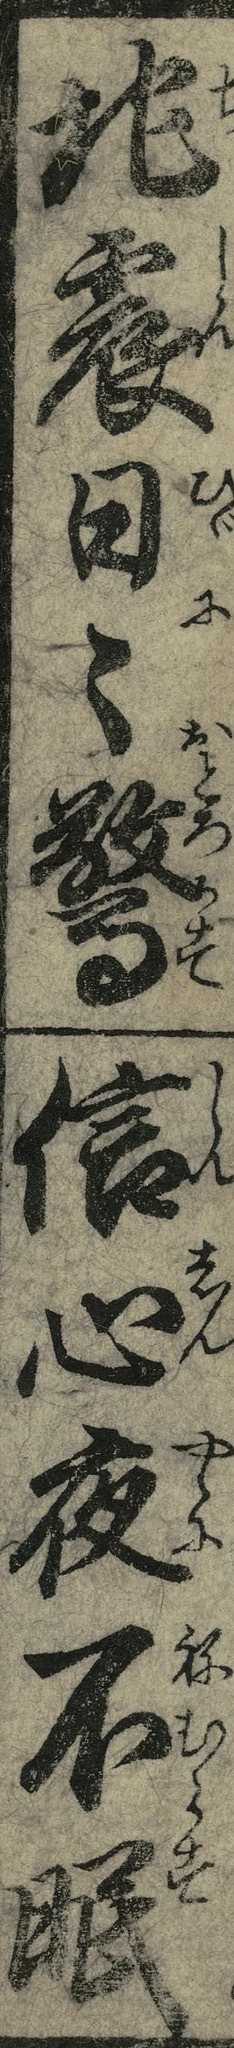地震日々驚信心夜不眠
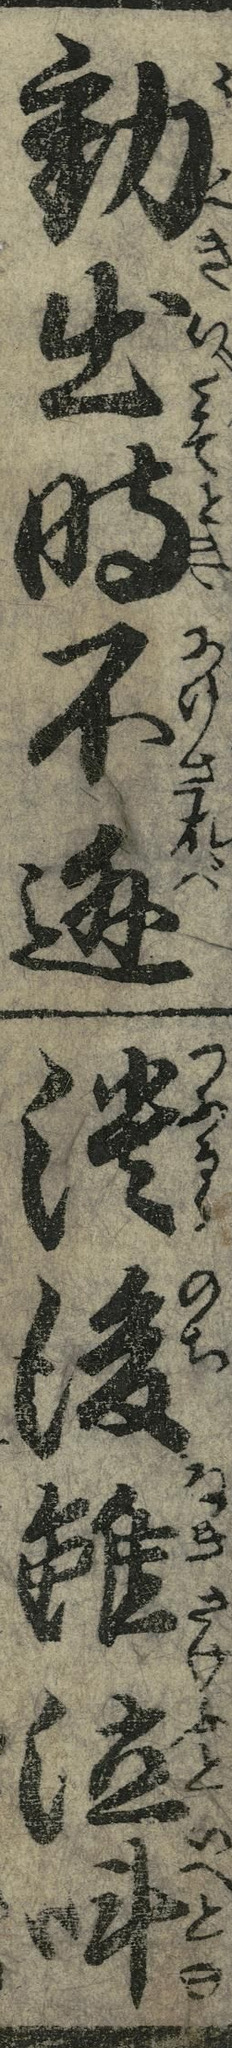動出時不逃潰後雖泣叫
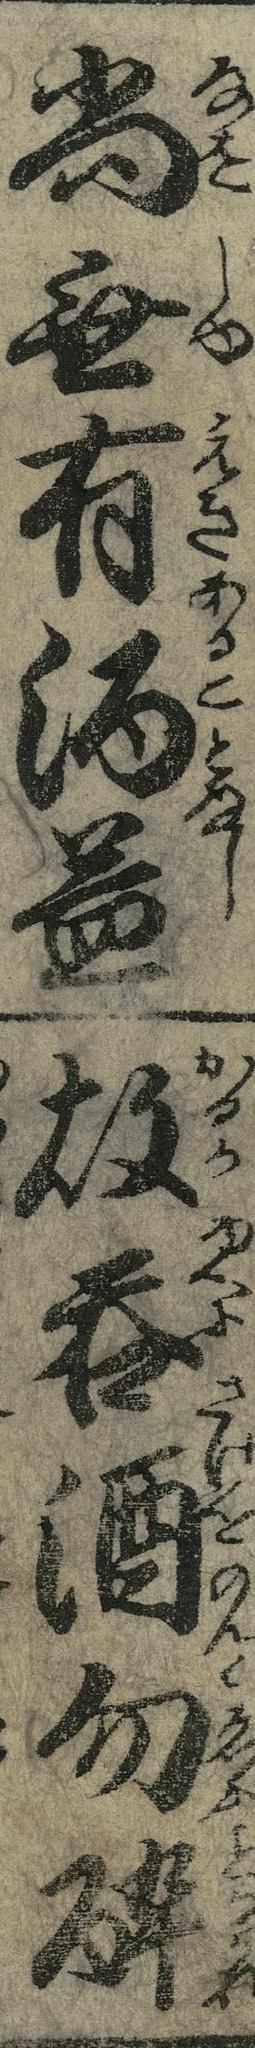尚無有酒益故呑酒勿砕
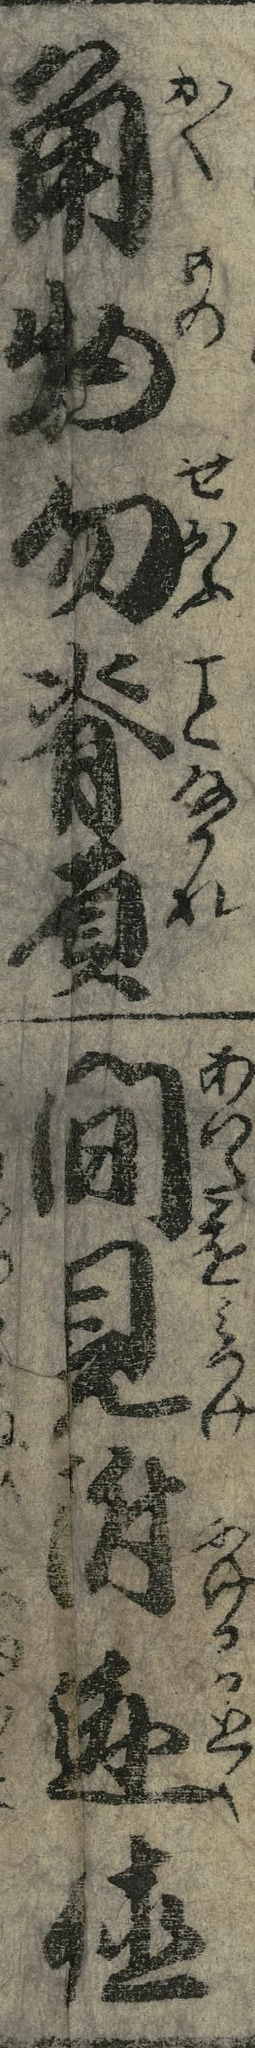角物勿背負間見附逃徳
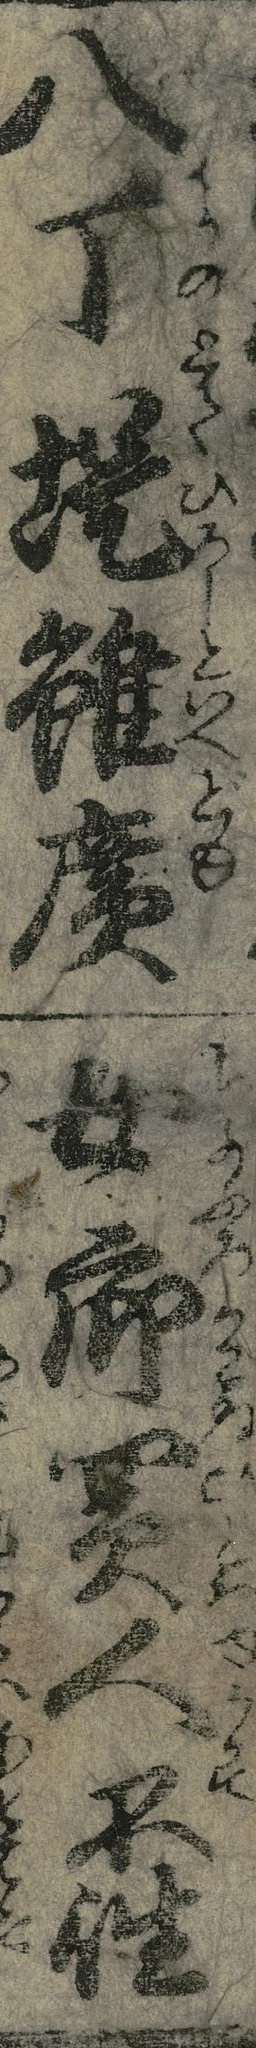八丁堤雖広女廓買人不徃
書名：大江戸　地震後教　人事改正　平かな附
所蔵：東京大学地震研究所図書室 Earthquake Research Institute Library, The University of Tokyo, JAPAN
